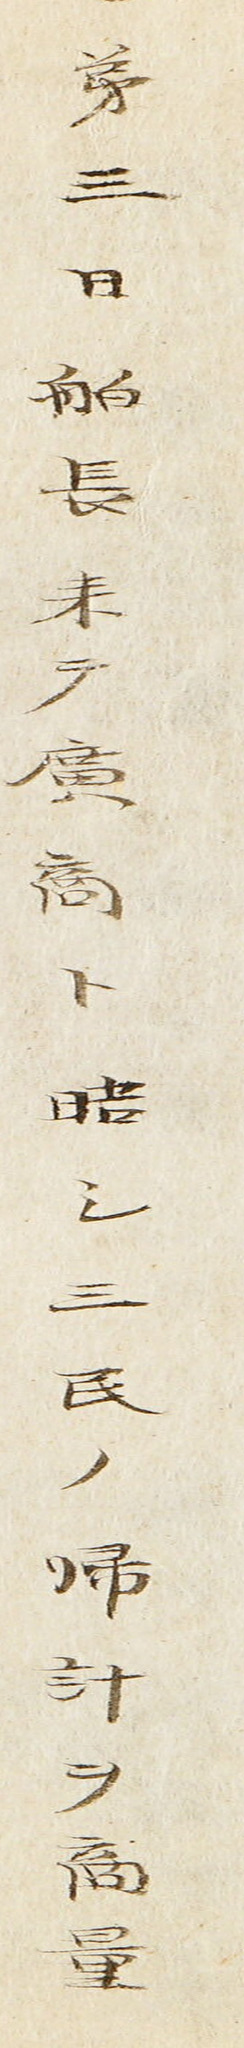○第三日舶長来テ広商ト晤シ三民ノ帰計ヲ商量
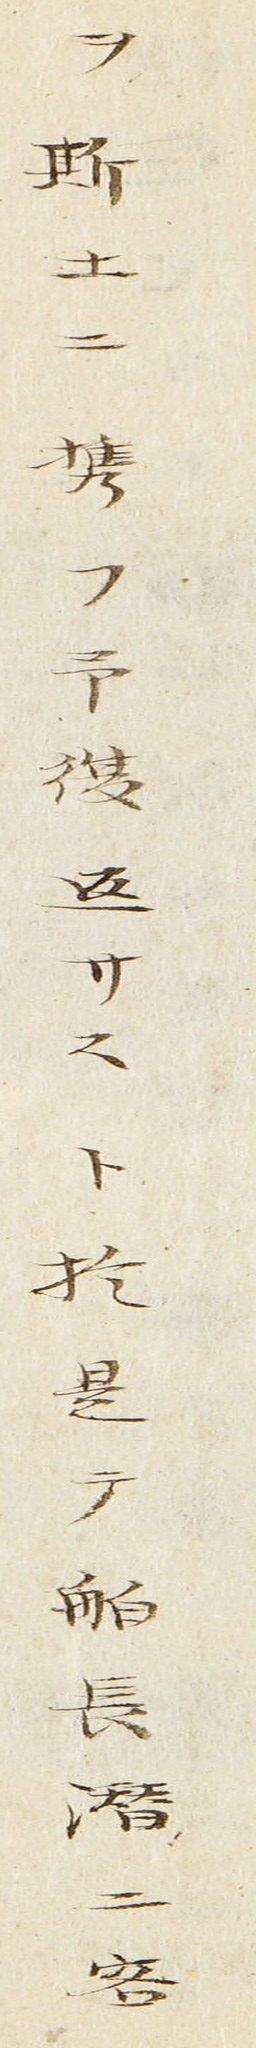ヲ斯土ニ携フ予復返サスト於是テ舶長潜ニ客
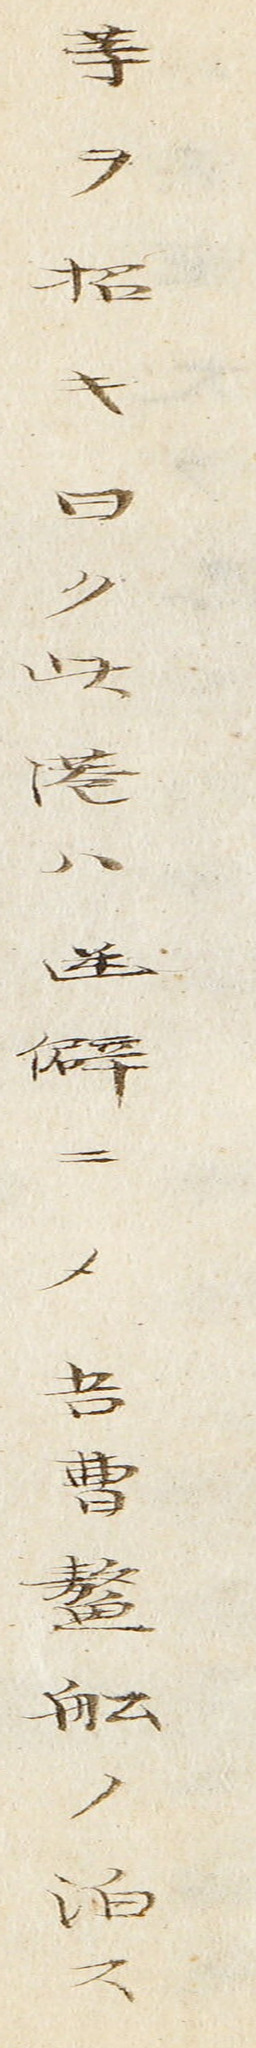等ヲ招キ曰ク此港ハ僻ニシテ吾曹鰲船ノ泊ス
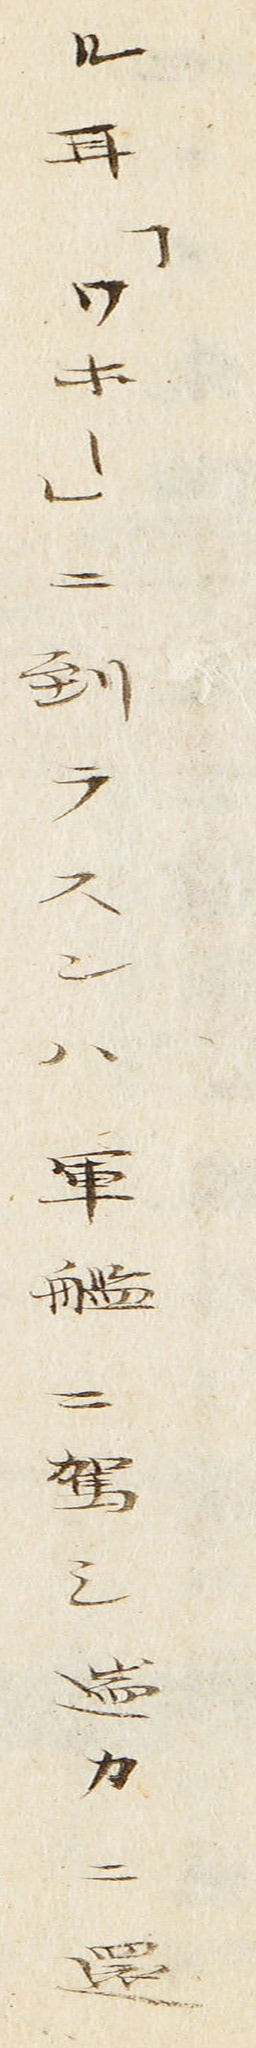ル耳「ワホー」ニ到ラスンハ軍艦ニ駕シ遄カニ還
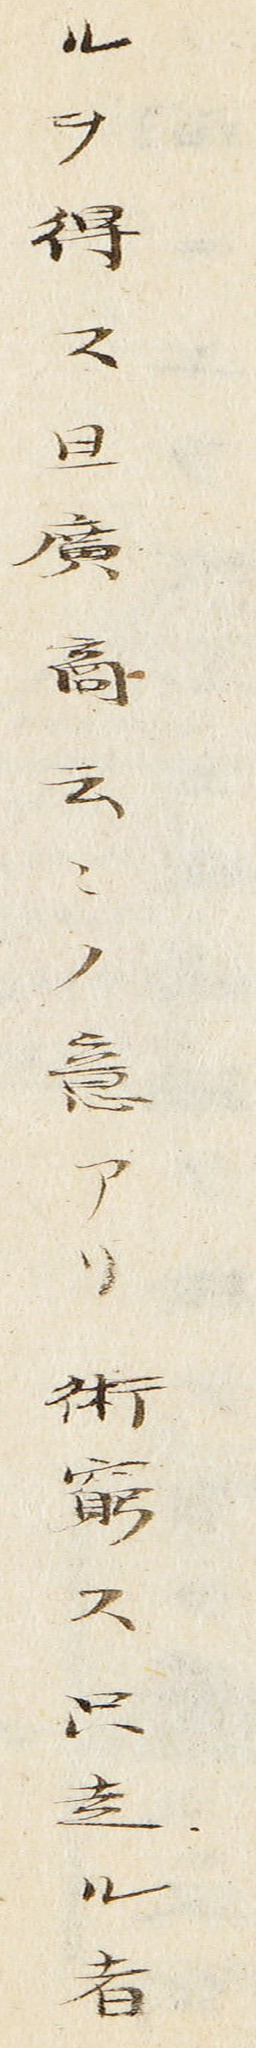ルヲ得ス且広商云々ノ意アリ術窮ス只走ル者
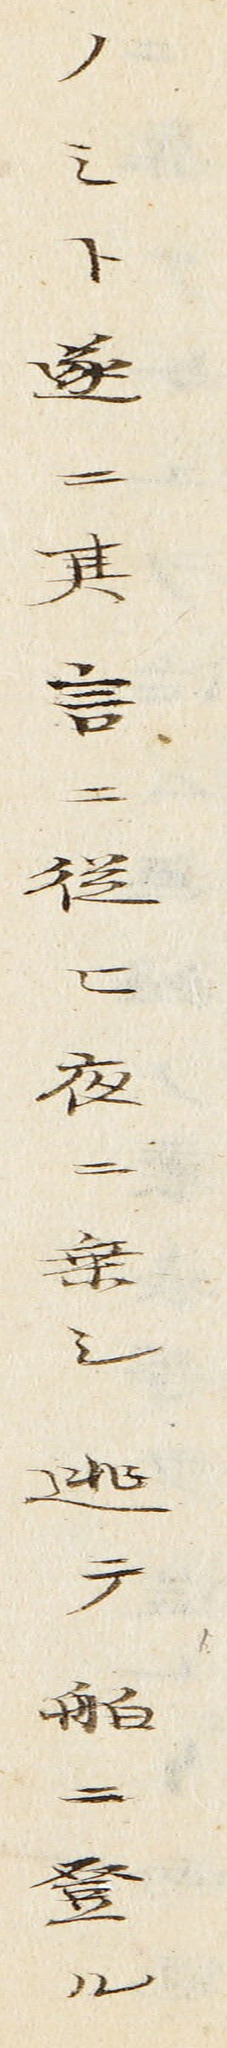ノミト遂ニ其言ニ従ヒ夜ニ乗シ逃テ舶ニ登ル
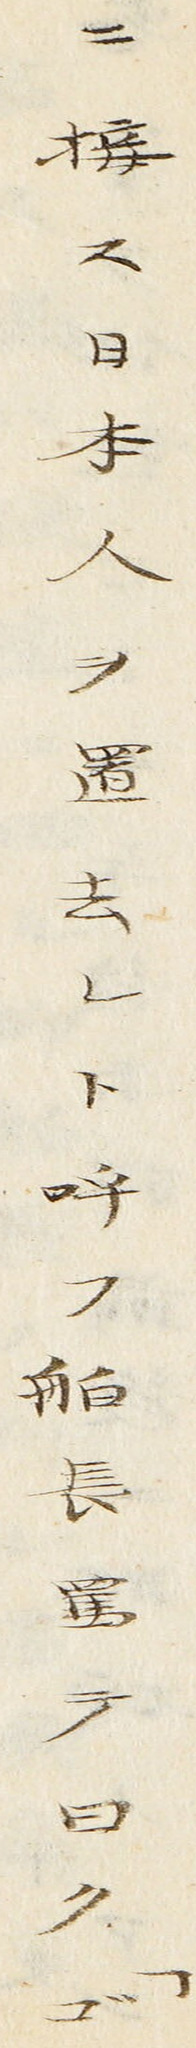ニ接ス日本人ヲ置去レト呼フ舶長罵テ曰ク「ゴ
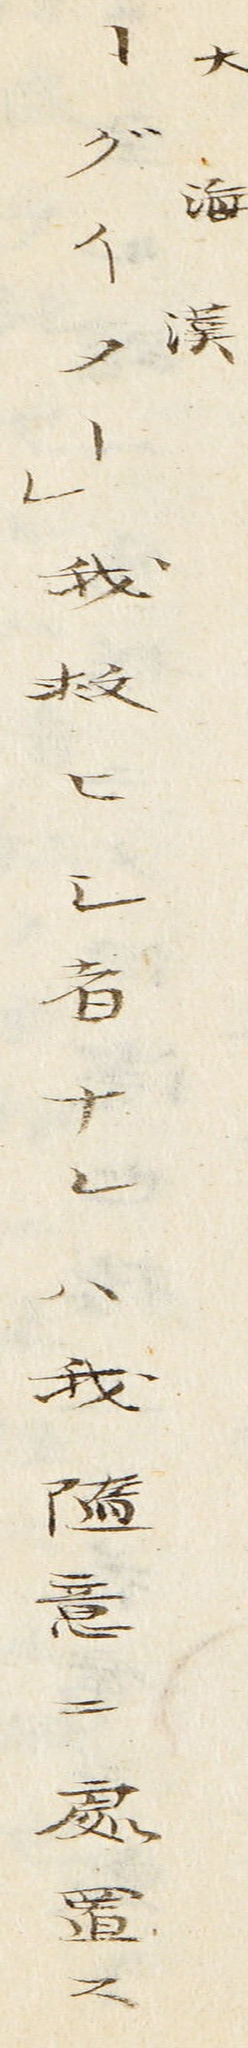ーグイメー」我救ヒシ者ナレハ我随意ニ処置ス
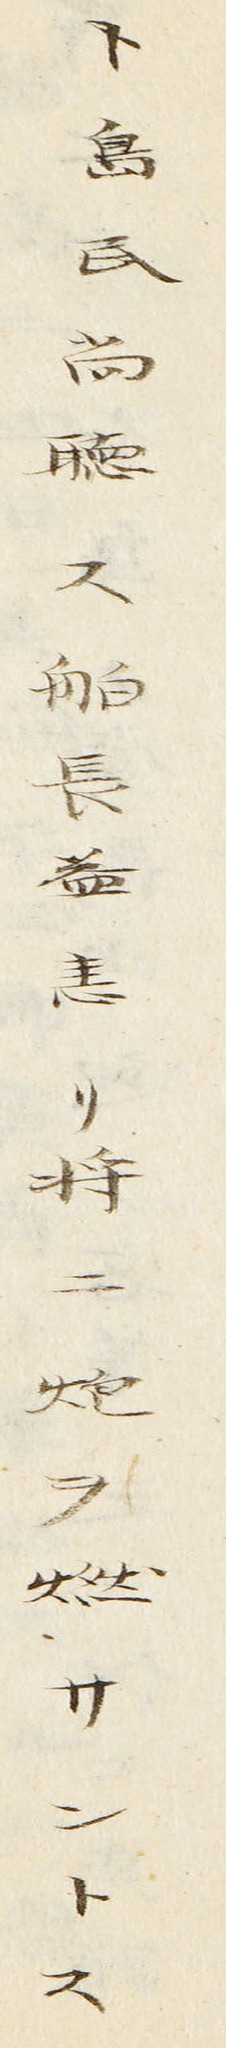ト島民尚聴ス舶長益恚リ将ニ炮ヲ燃サントス
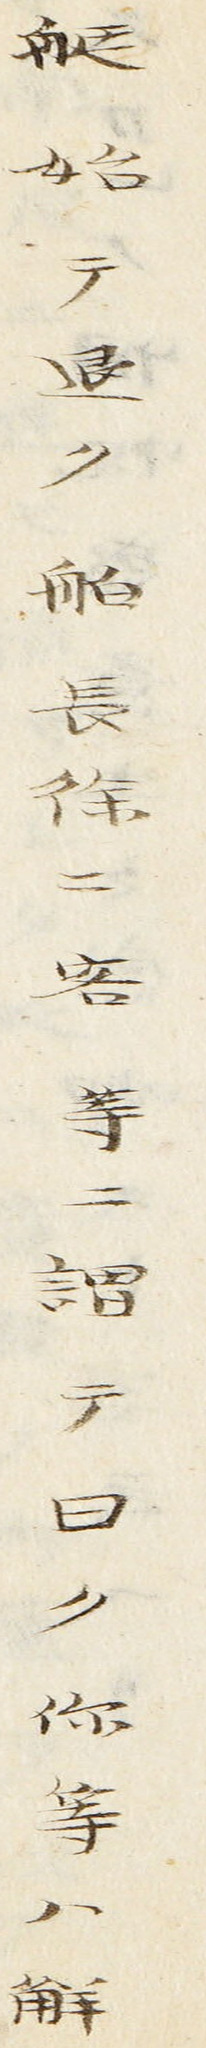艇始テ退ク舶長徐ニ客等ニ謂テ曰ク你等ハ觧
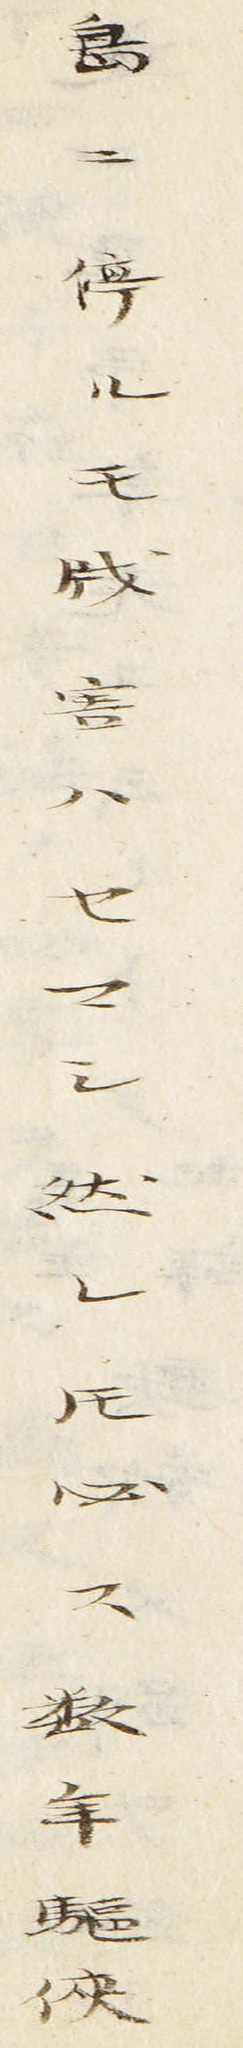島ニ停ルモ害ハセマシ然レトモ必ス数年駆俠
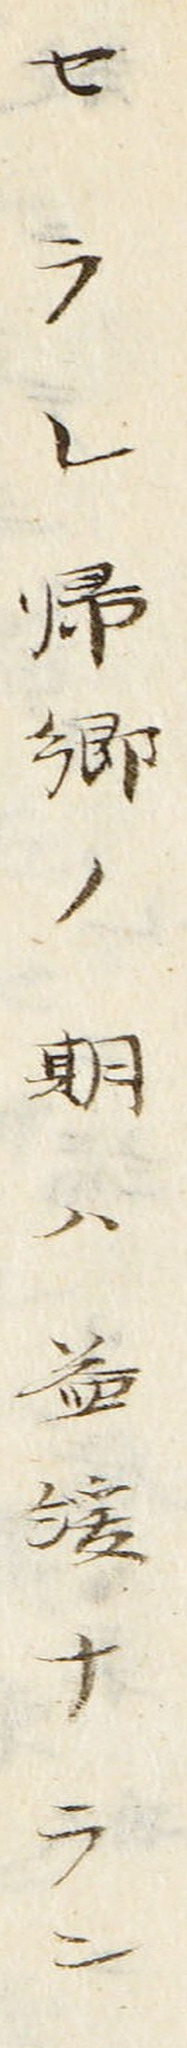セラレ帰郷ノ期ハ益ナラン
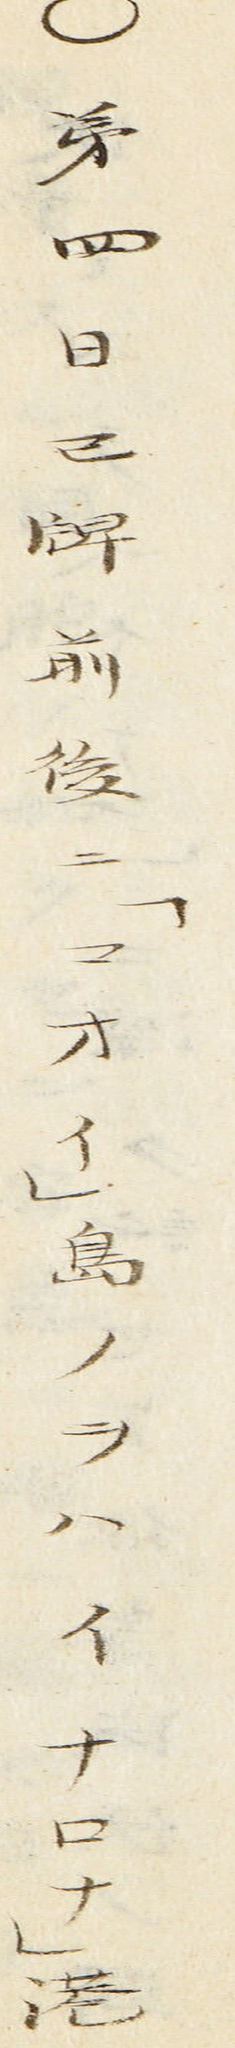○第四日己牌前後ニ「マオイ」島ノヲハイナロナ」港
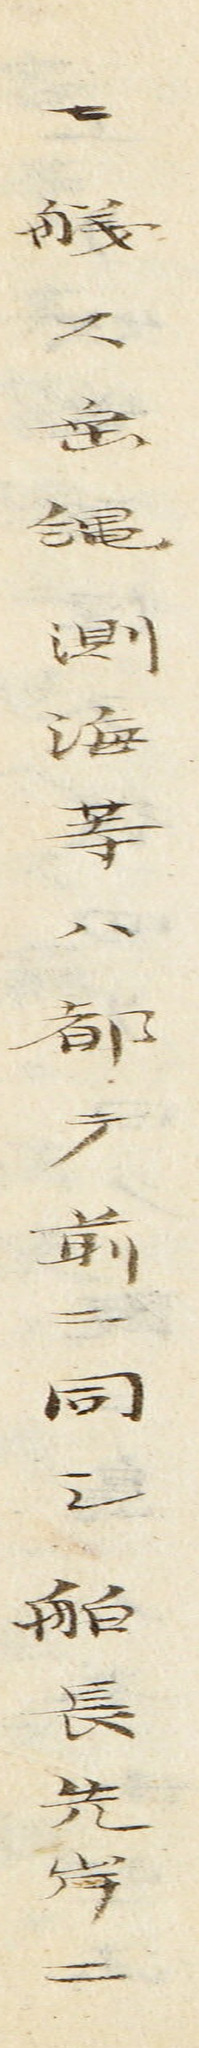ニ艤ス垂縄測海等ハ都テ前ニ同シ舶長先岸ニ

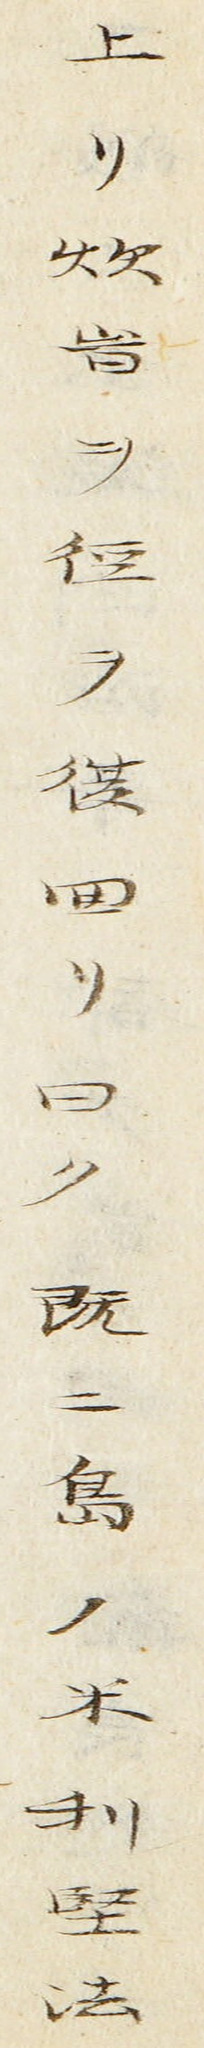上リ炊旹ヲ徑ヲ復回リ曰ク既ニ島ノ米利堅法
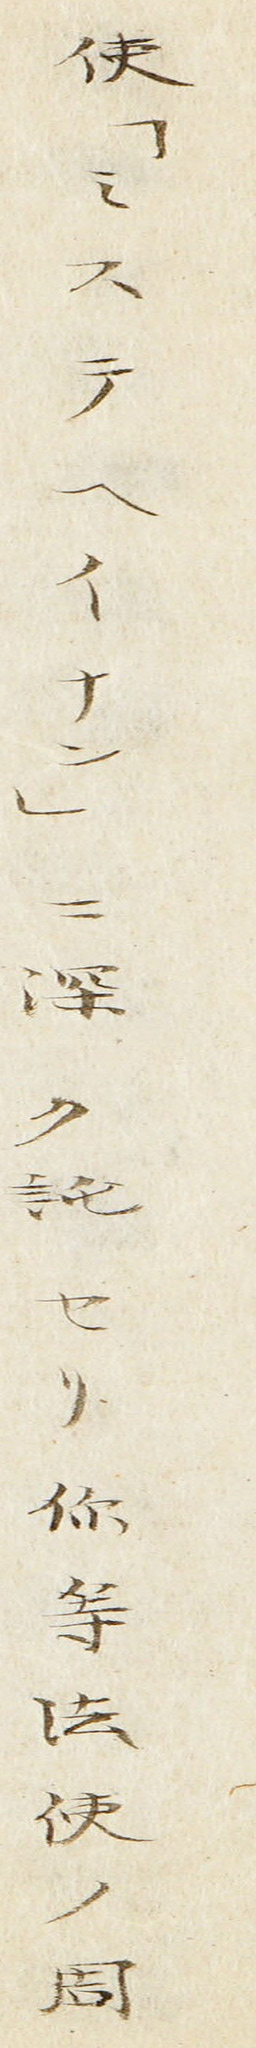使「ミステヘイナン」ニ深ク託セリ你等法使ノ周
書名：流蕃通書
